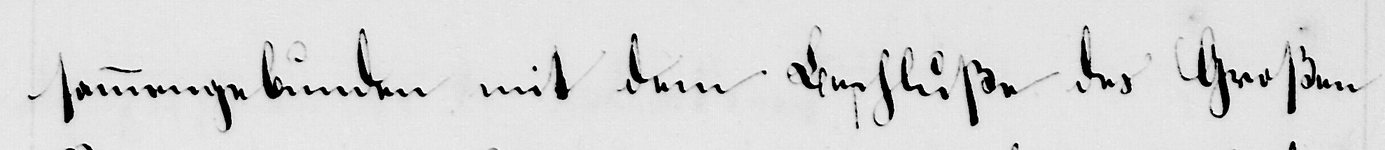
sammengebunden mit dem Beschluße des Großen
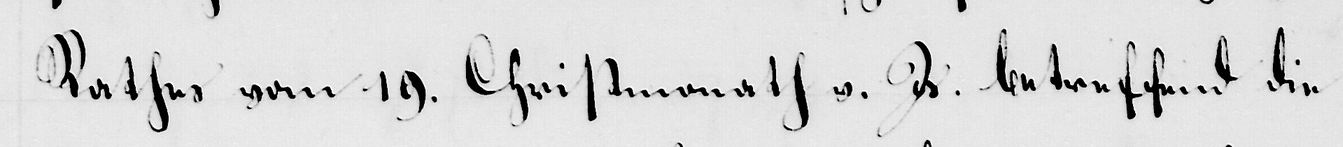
Rathes vom 19. Christmonath v. Js. betreffend die
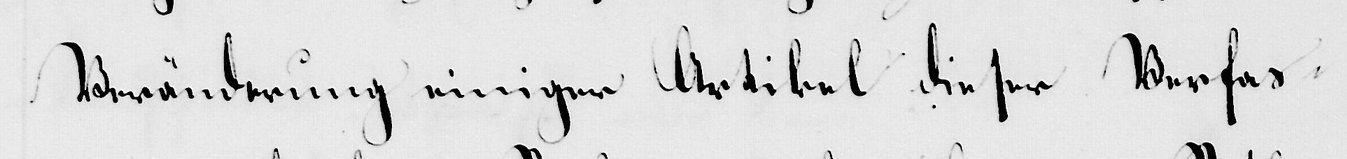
Veränderung einiger Artikel dieser Verfaß¬
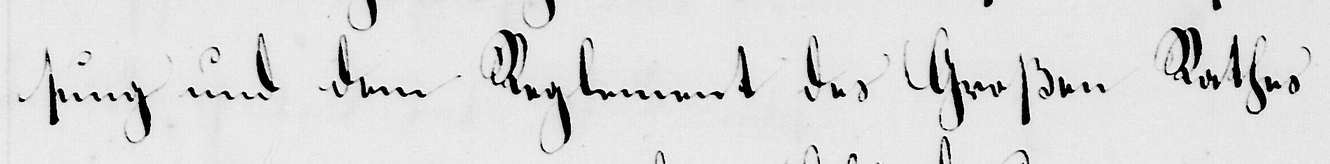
ung und dem Reglement des Großen Rathes
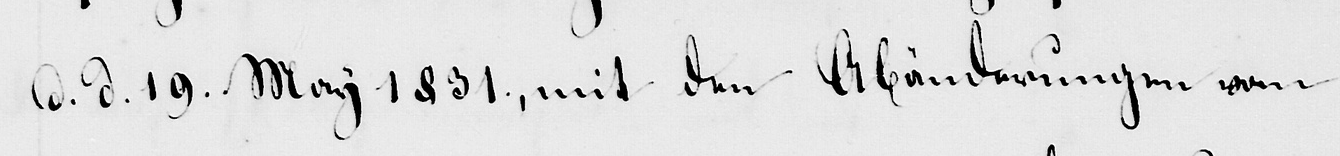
d. d. 19. May 1831., mit den Abänderungen vom
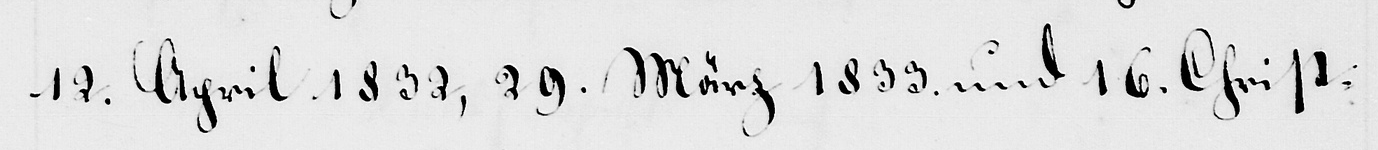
12. April 1832, 29. März 1833. und 16. Christ¬
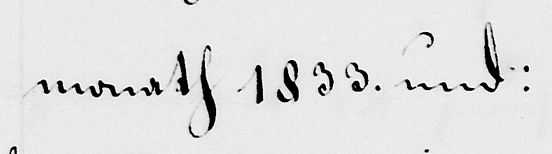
monath 1833. und:
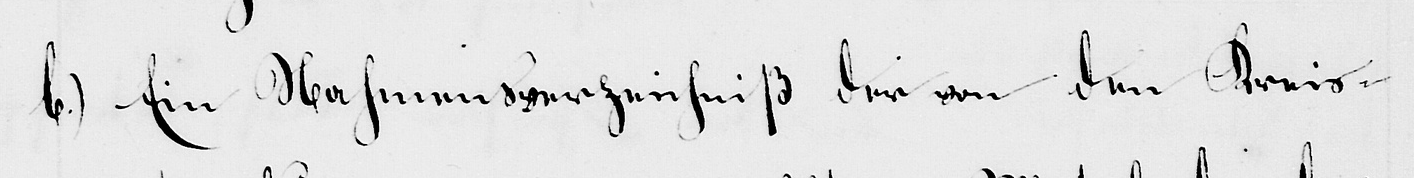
b.) ein Nahmensverzeichniß der von den Kreis¬
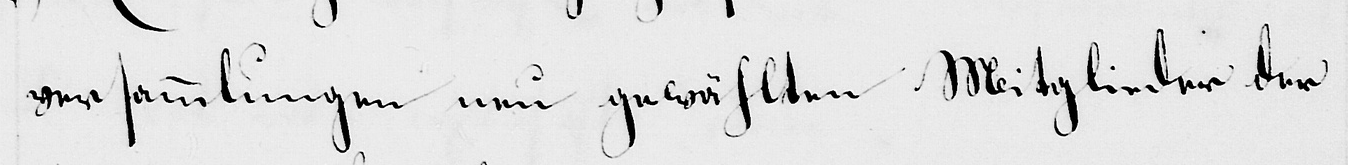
versammlungen neu gewählten Mitglieder der
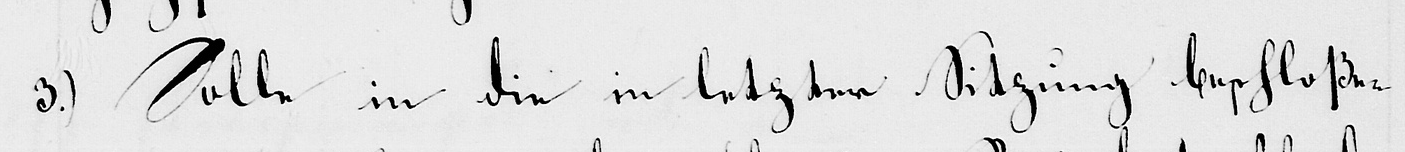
3.) Solle in die in letzter Sitzung beschloße¬
